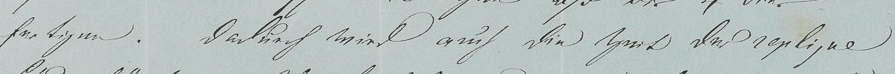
fertigen. Dadurch wird auch die Zeit der replique
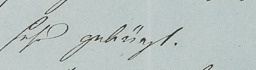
sehr gekürzt.
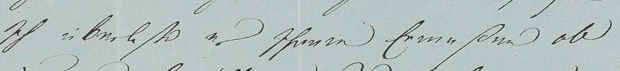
Ich überlaße es Ihrem Ermeßen ob
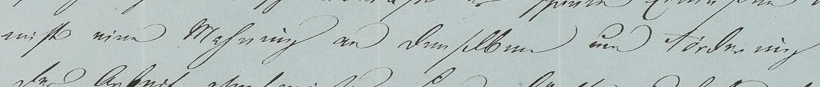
nicht eine Mahnung an denselben um Förderung
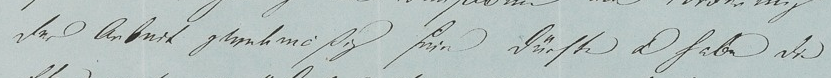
der Arbeit zwekmäßig sein dürfte & habe die
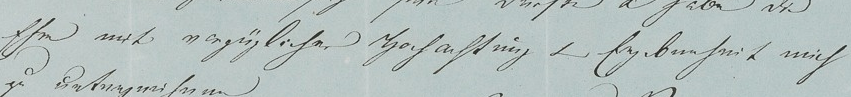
Ehre mit vorzüglicher Hochachtung & Ergebenheit mich
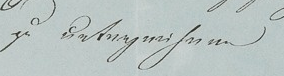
zu unterzeichnen
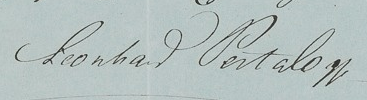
Leonhard Pestalozzi
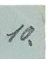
1850
